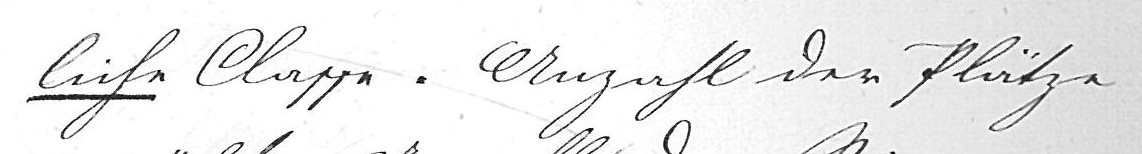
liche Classe. Anzahl der Plätze
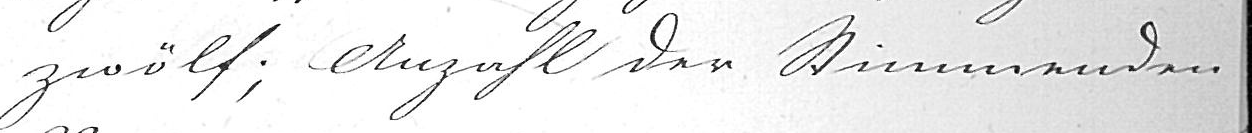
zwölf; Anzahl der Stimmenden
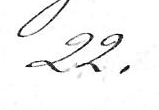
22.
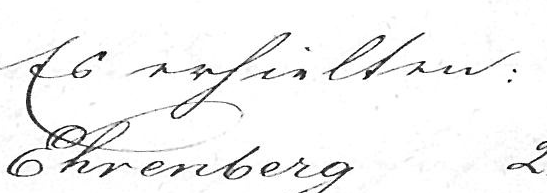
Es erhielten:
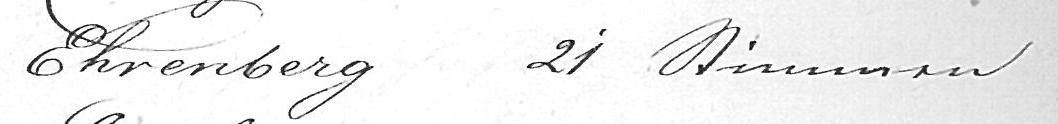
Ehrenberg 21 Stimmen
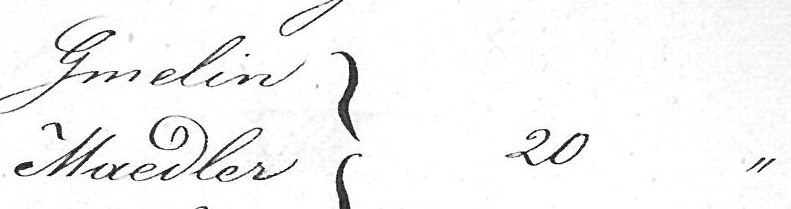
Gmelin 20 "
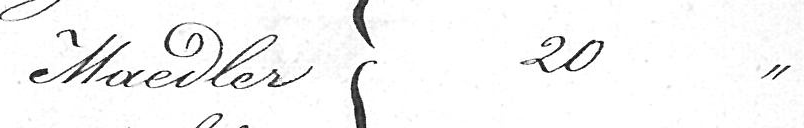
Maedler 20 "
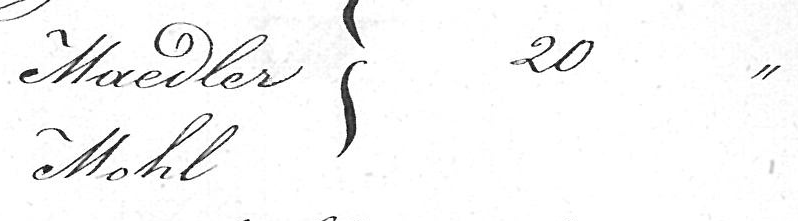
Mohl 20 "
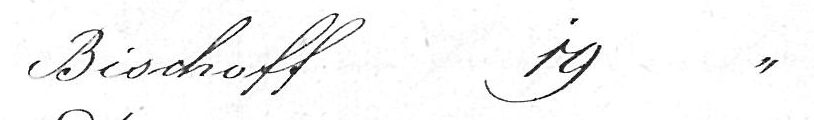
Bischoff 19 "
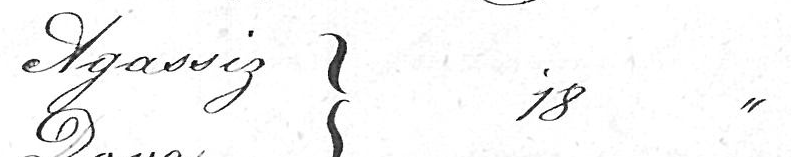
Agassiz 18 "
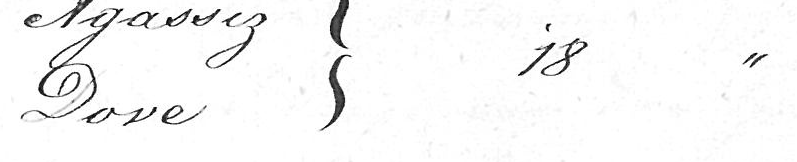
Dove 18 "
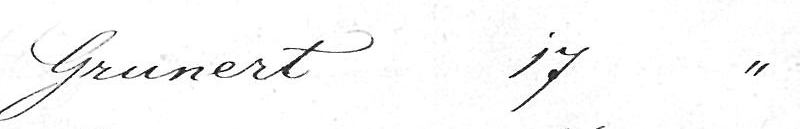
Grunert 17 "
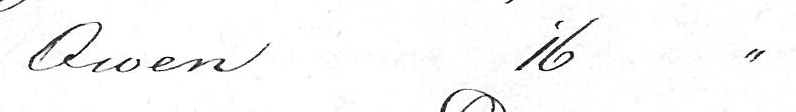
Owen 16 "
